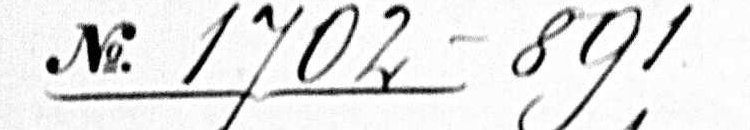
No 1702– 1891
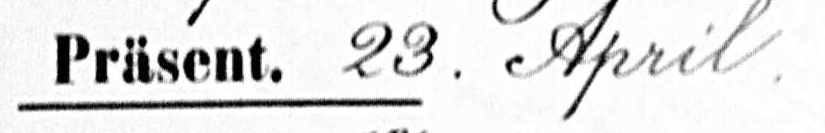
Präsent. – 23. April
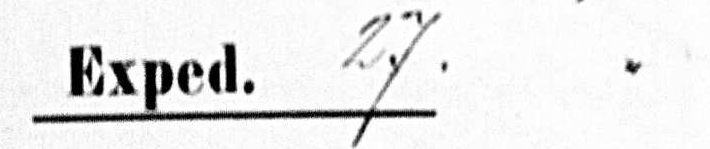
Exped. – 27. „
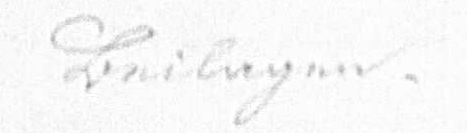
Beilagen
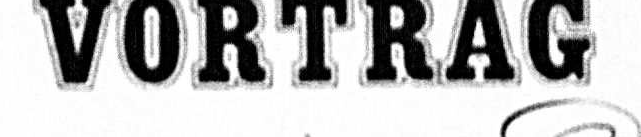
VORTRAG
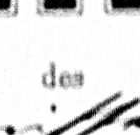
des
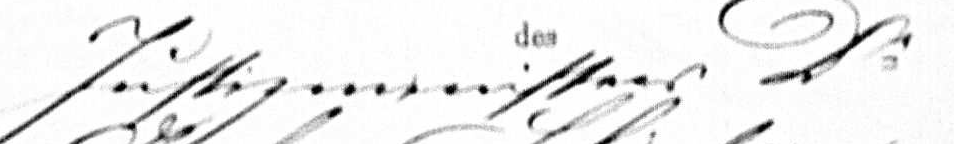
Justizministers Dr.
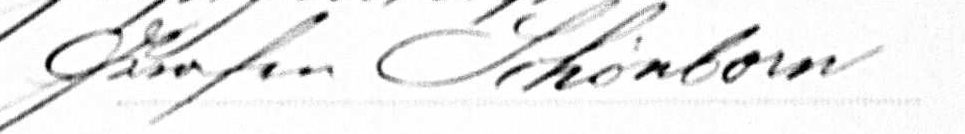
Grafen Schönborn
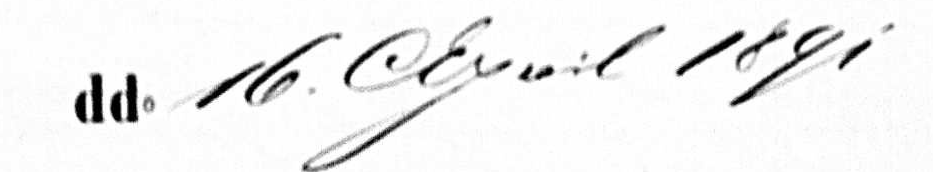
Ddo 16. April 1891
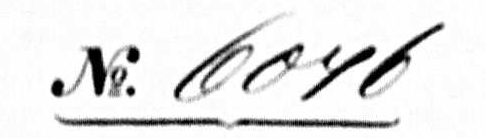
No. 6046
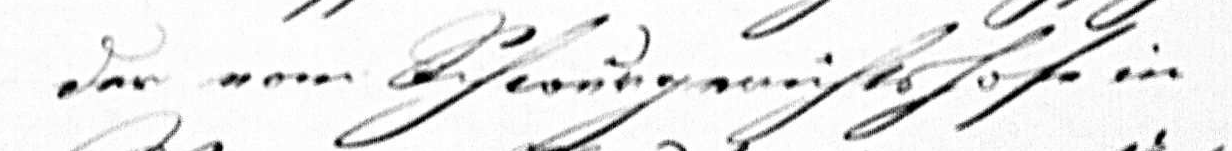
der vom Schwurgerichtshofe in
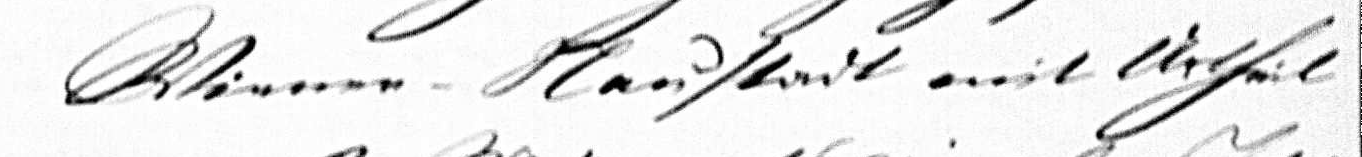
Wiener-Neustadt mit Urtheil
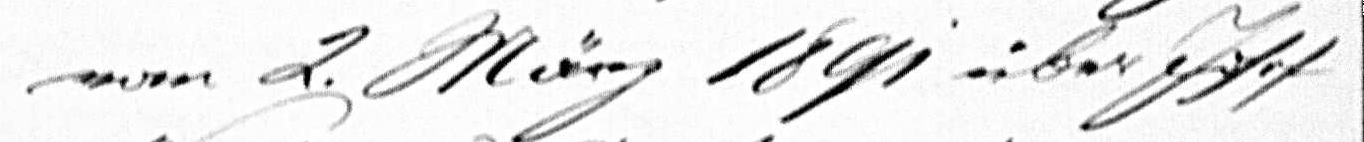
vom 2. März 1891 über Josef
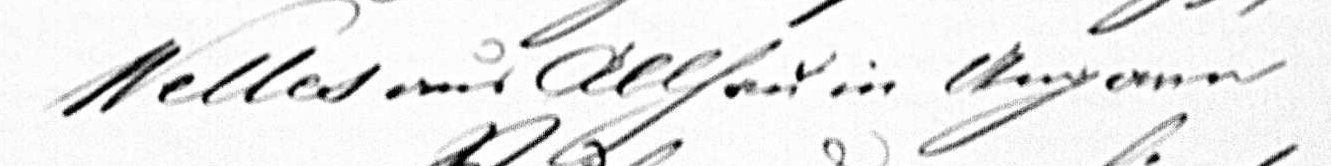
Welles aus Allhau in Ungarn
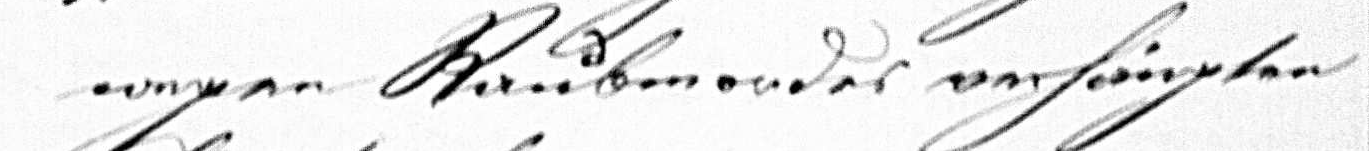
wegen Raubmordes verhängten
